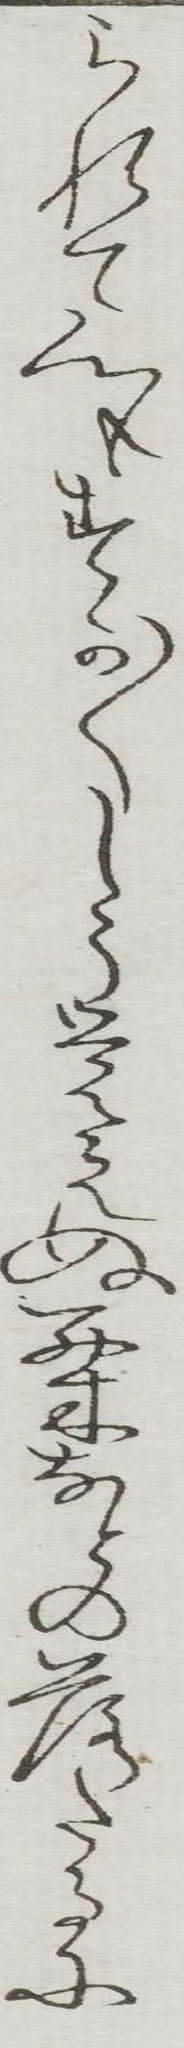られて心もすか〳〵しう覚えぬ栗なとの落たるに

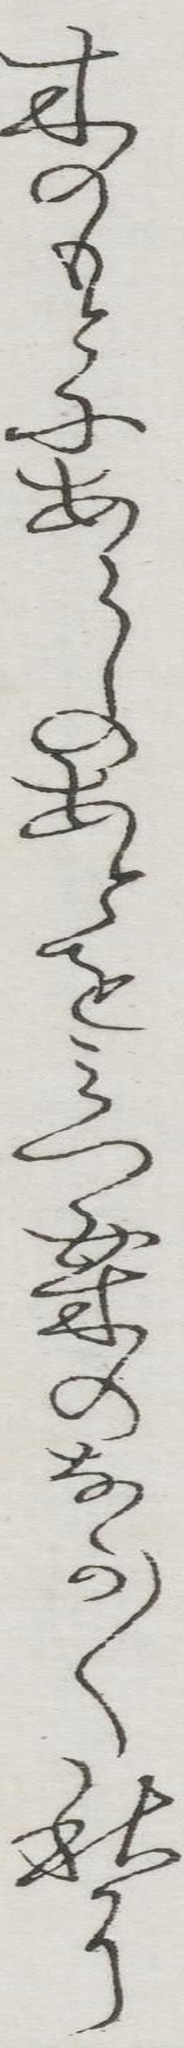木のもとにあらしのあとをみつ栗のなか〳〵秋に
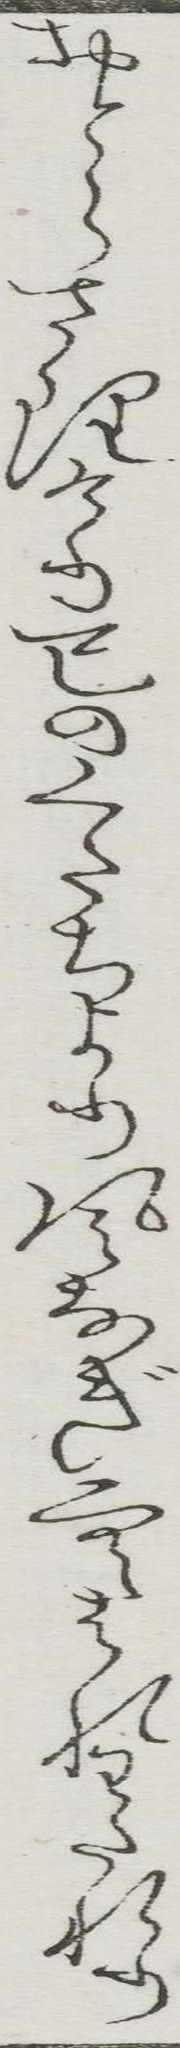おとらさりけり巳のくたちより風なぎ空はれわたれり
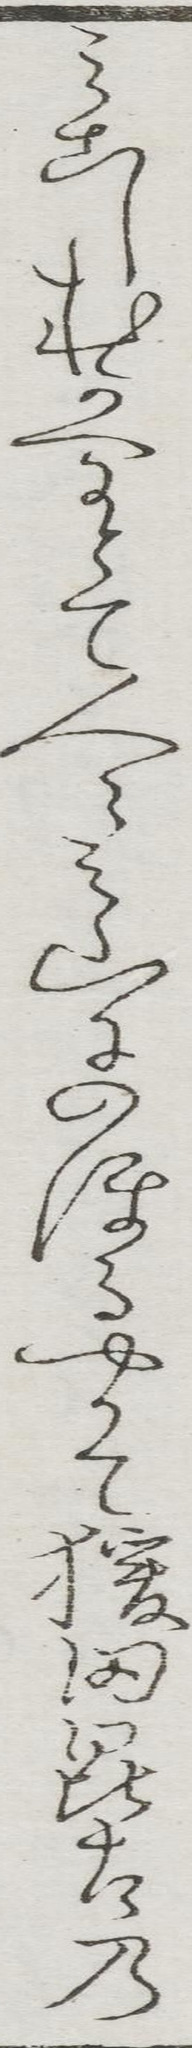みこしむかへにとて人々み山にのほるやかて猨田毘古の
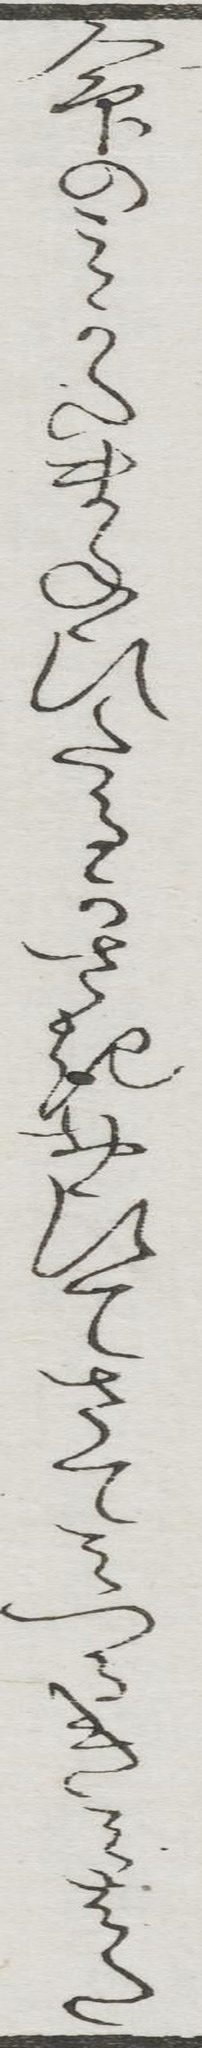命のみかたまねひたるかさきおひてさてみつるきみはた
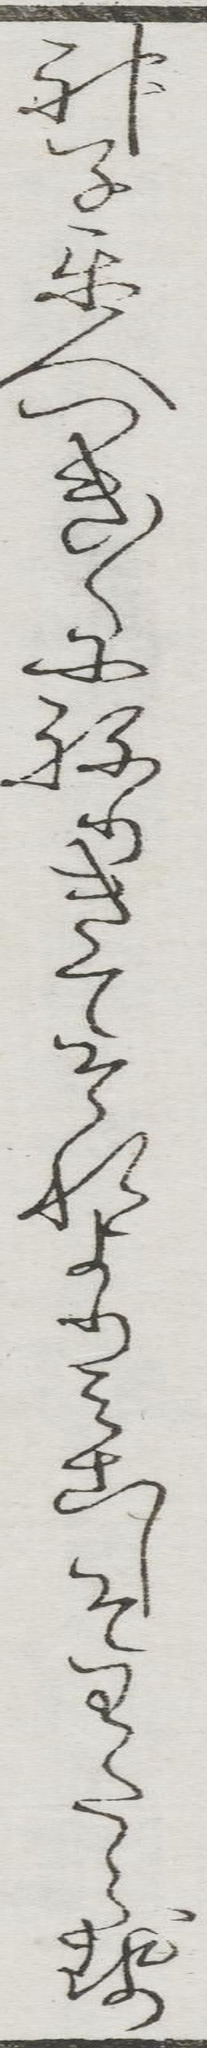神子楽人つき〳〵にねりきてそれよりみこしそわたらせ
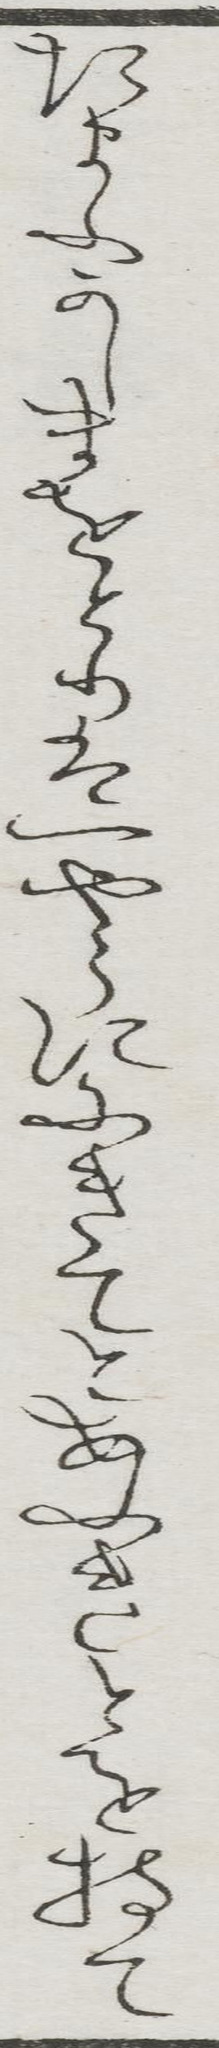たまふかしまをとりは一やうにふきてとあふきとを持た
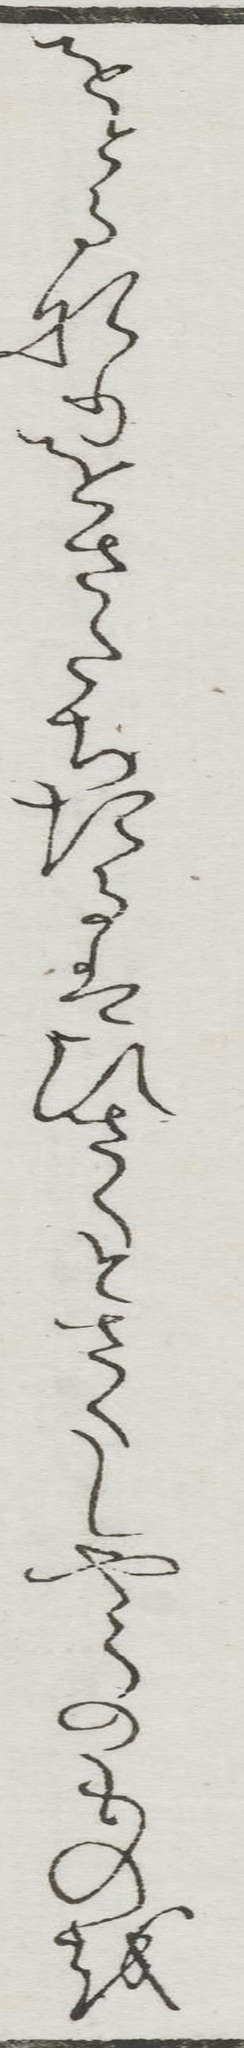をとるなりをさたちたるはひさくとさくしやうものを
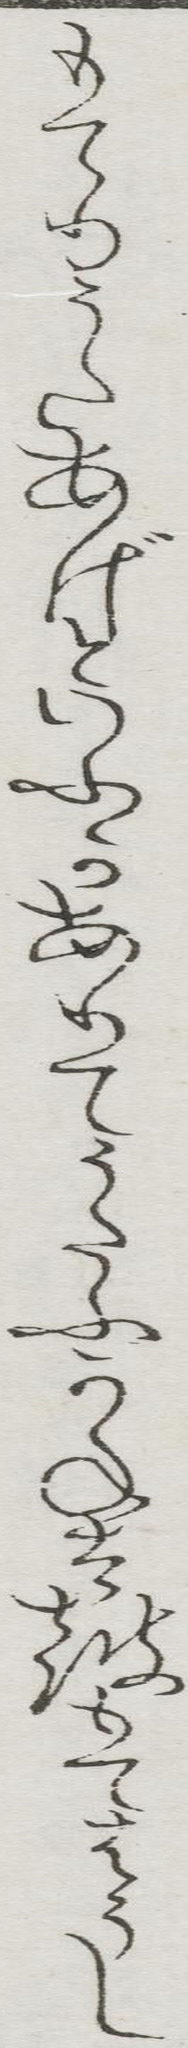もてりうたあげといふかありてうたふかね太鼓もてはうし
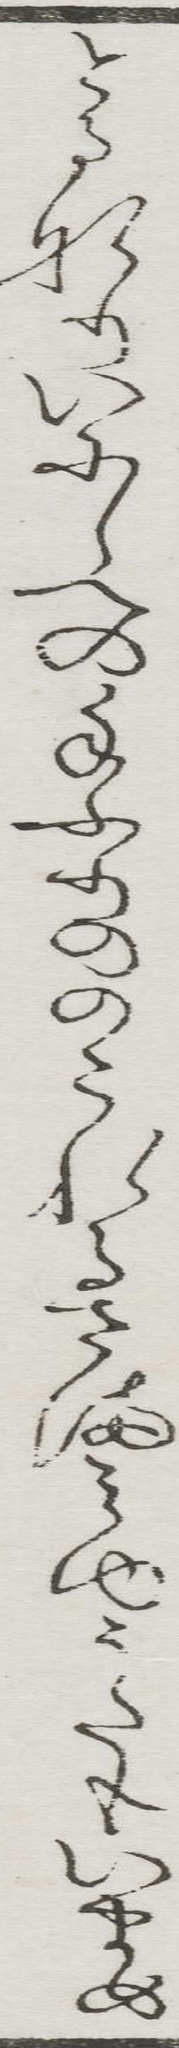とるなりいにしへの手ふりののこれるさまみゆうたもいまめ
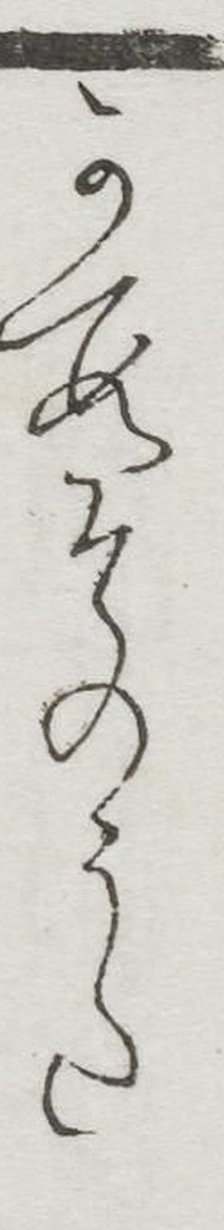かすそのうた
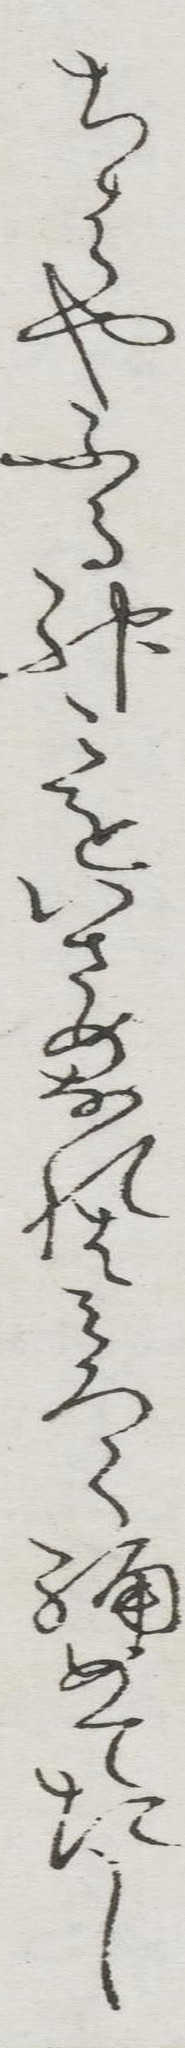ちはやふる神々をいさめなれはみろく踊めてたし
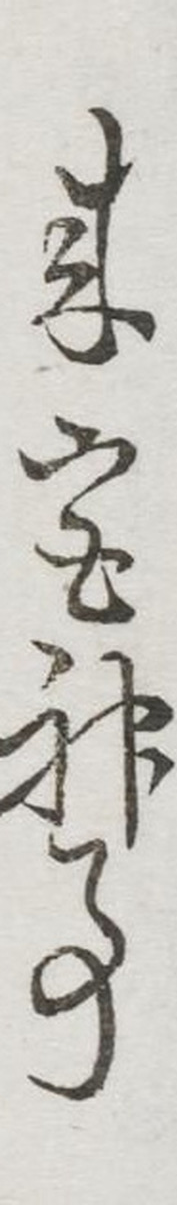来宮神事
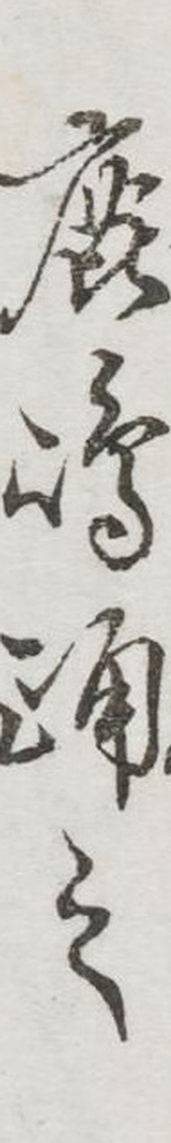鹿鳴踊之

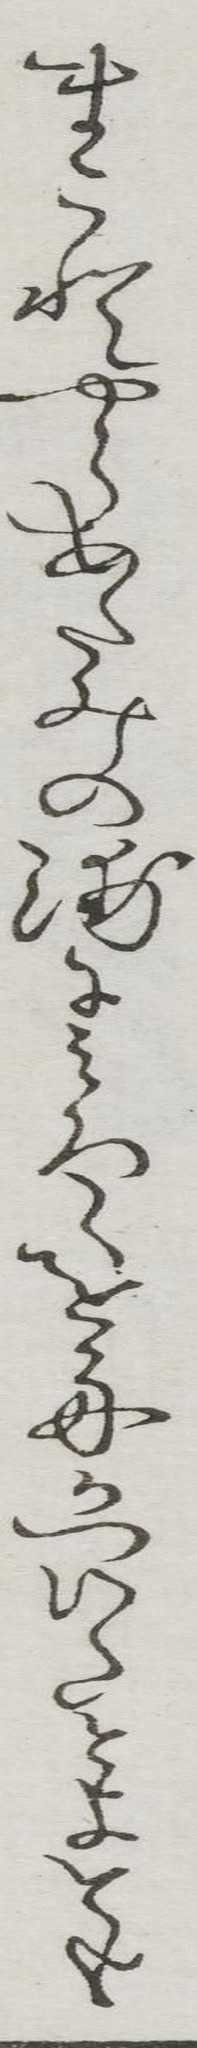まことやらあたみの浦にみろくを舟かついたとよとも
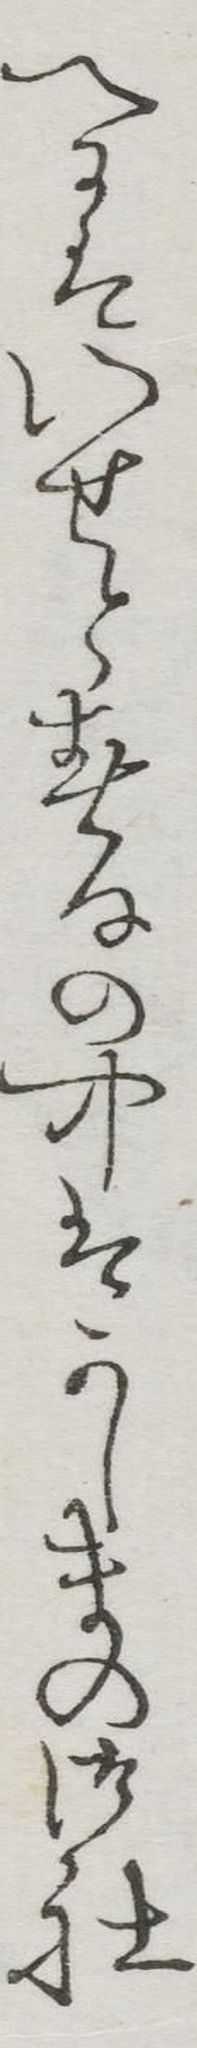へにはいせと春日の中はかしまの御社
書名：挿画熱海日記　全
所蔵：東京大学地震研究所図書室 Earthquake Research Institute Library, The University of Tokyo, JAPAN
